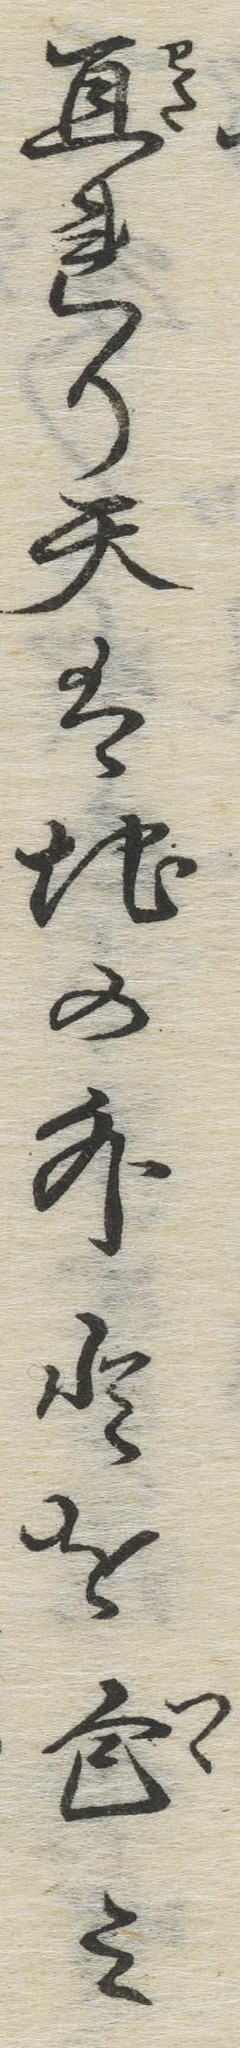亘れり天は地の外とを包み
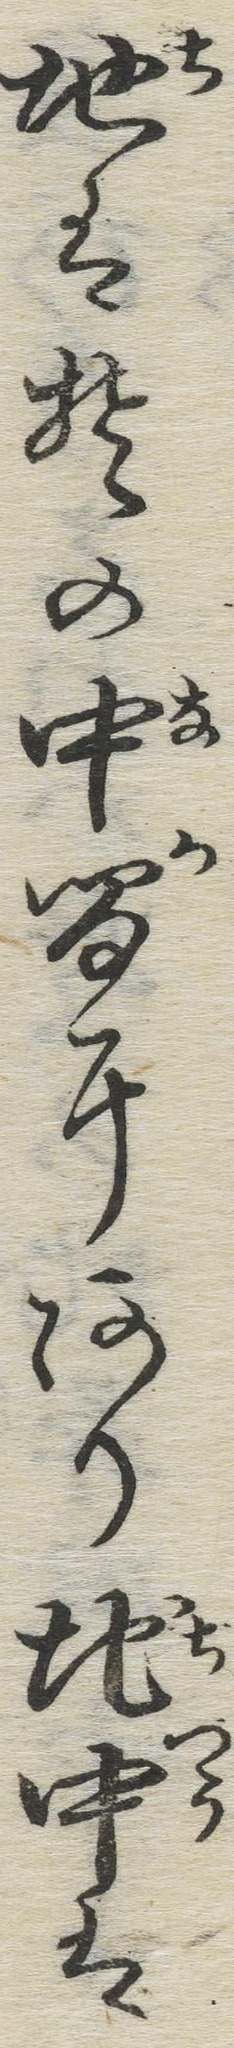地はその中間にあり地中は
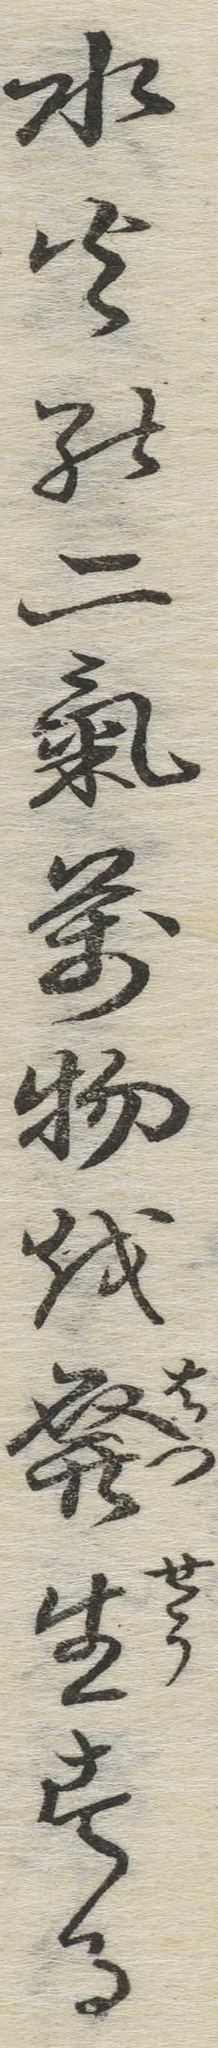水火の二気万物を発生する
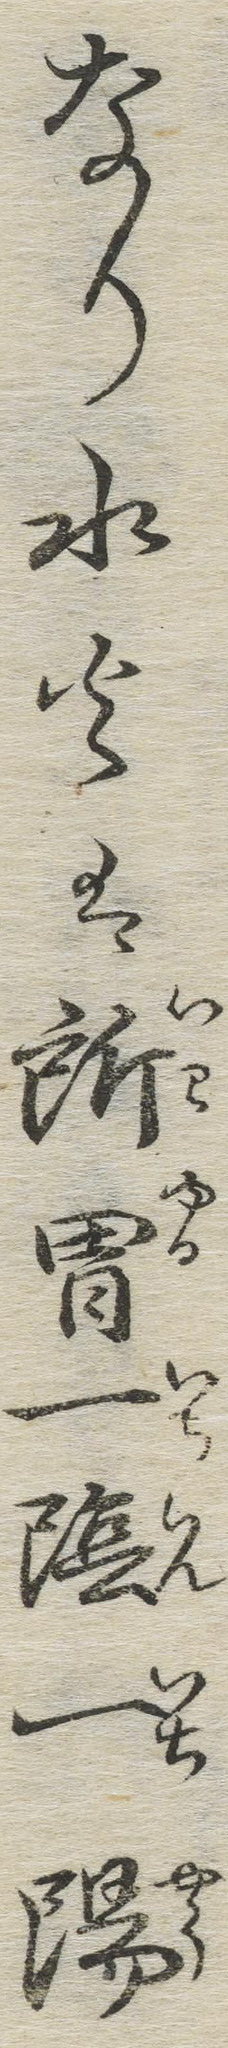なり水火は所謂一陰一陽
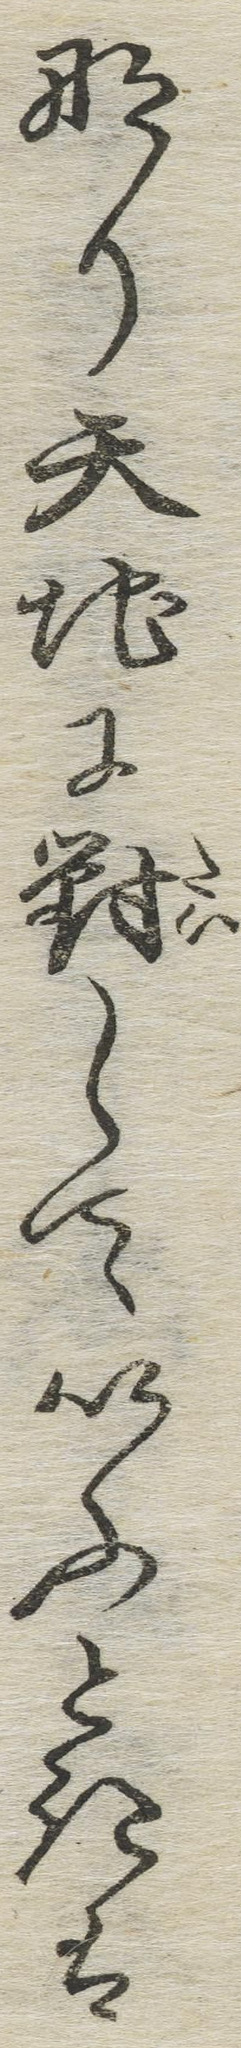なり天地に對していふときは
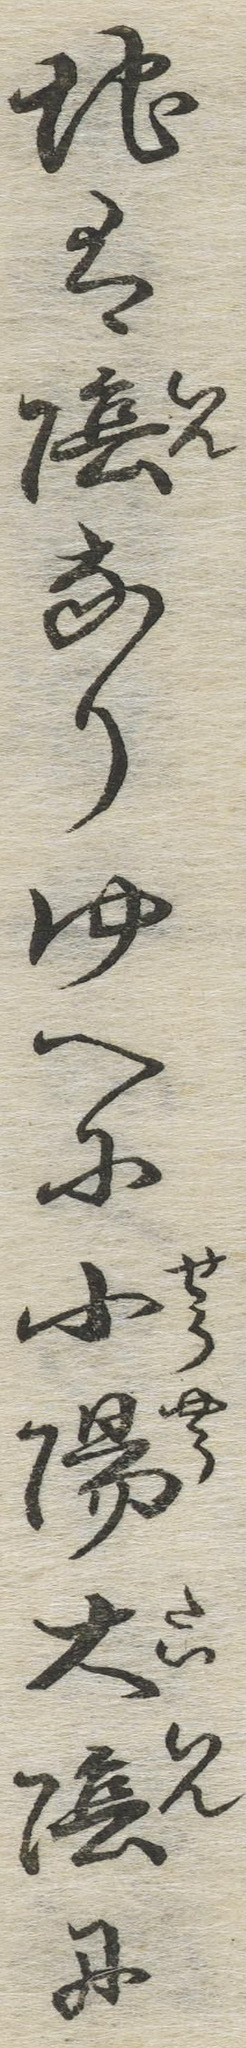地は陰なりゆへに小陽大陰に
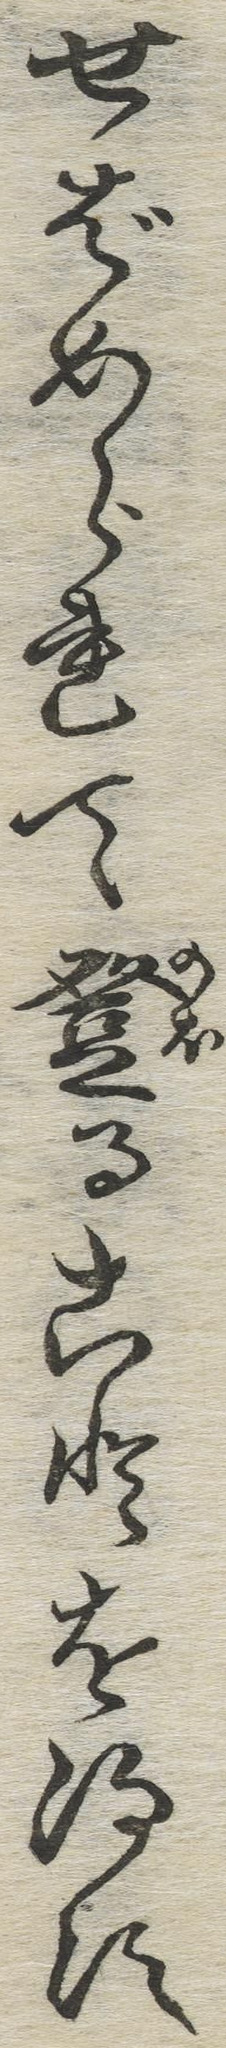せばめられて登ることをえす

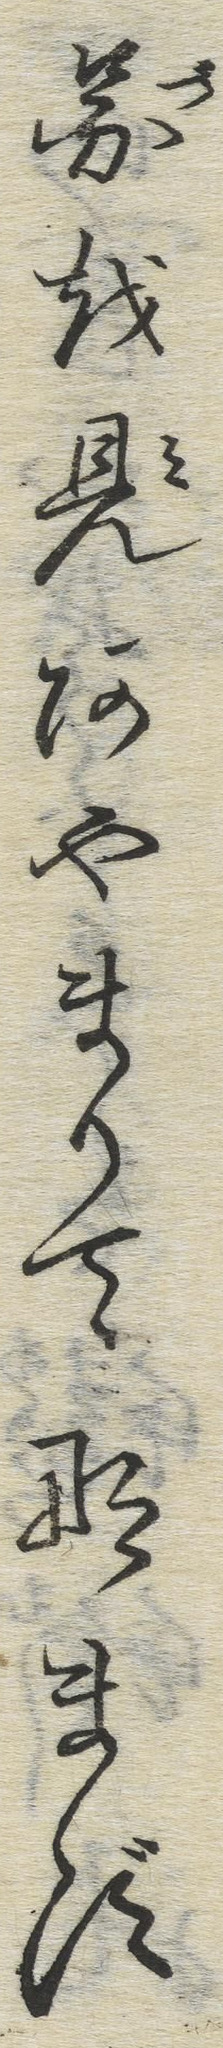圖を見あやまりてなまづ
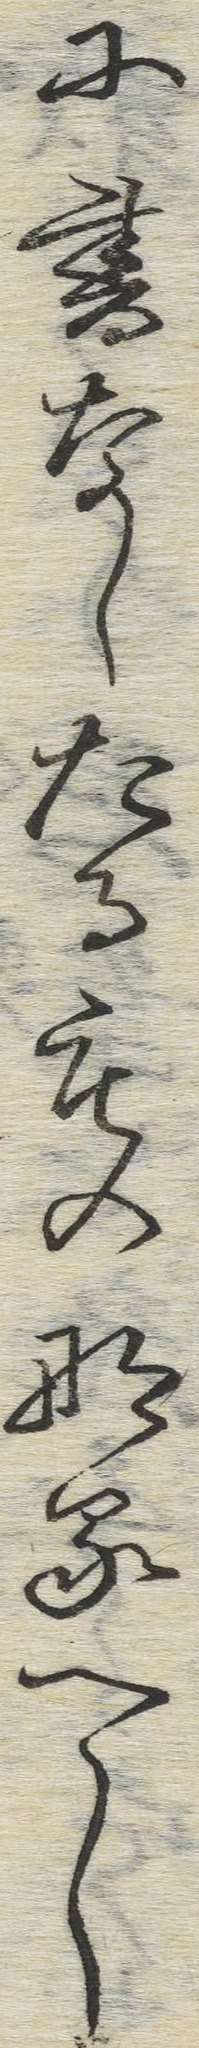に書なしたるものなるへし
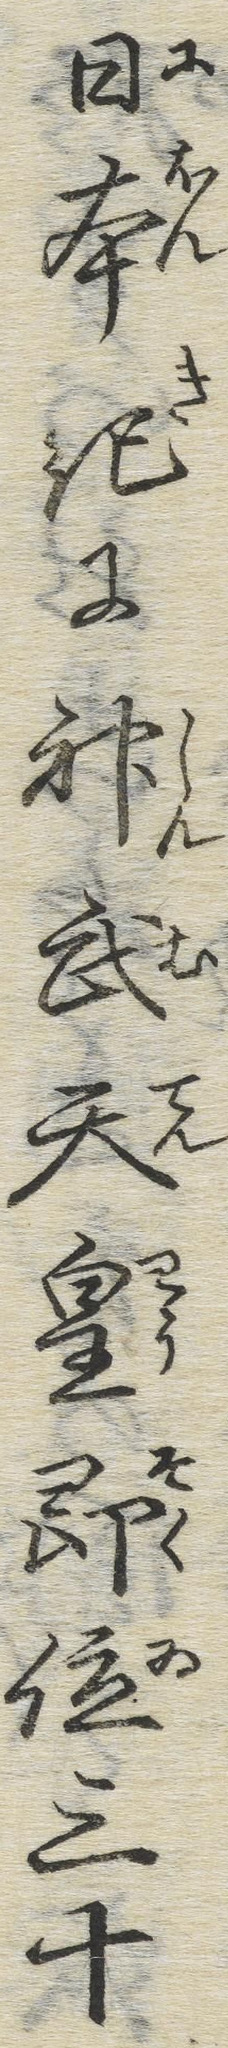日本紀に神武天皇即位三十
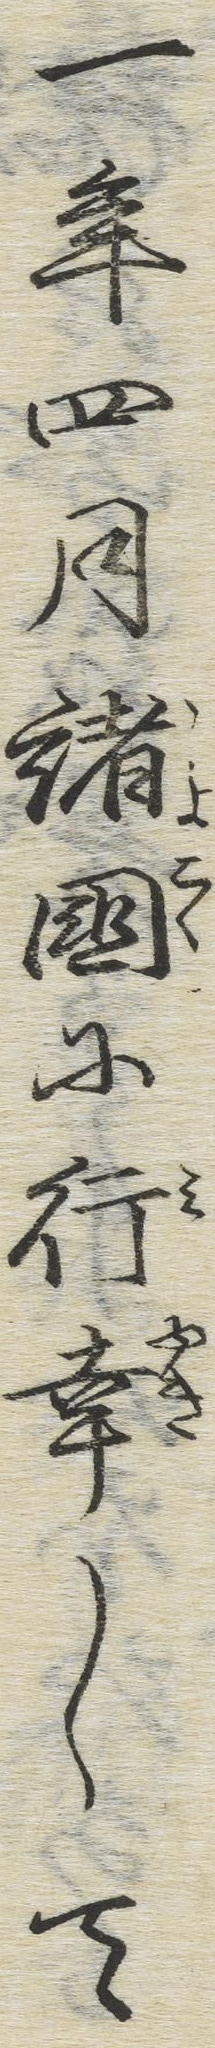一年四月諸国に行幸して
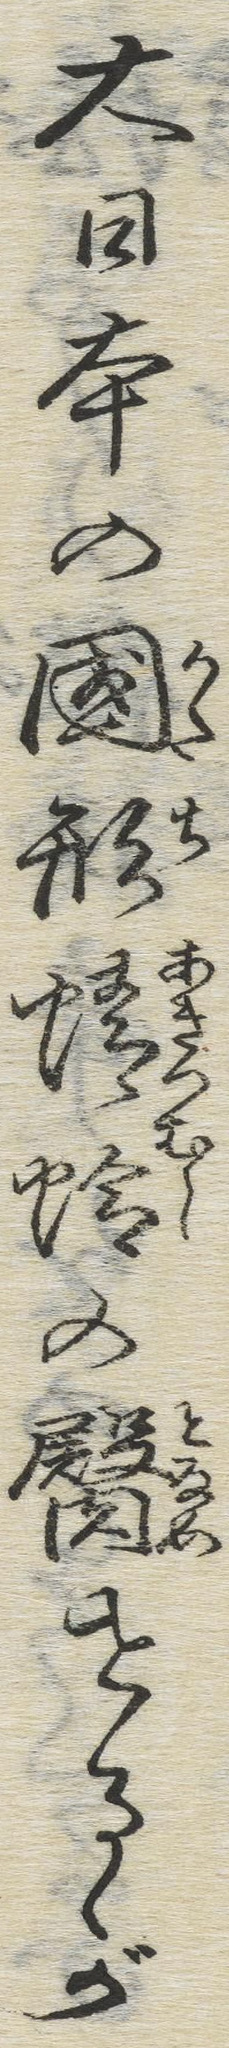大日本の国形蜻蛉の臋せるが
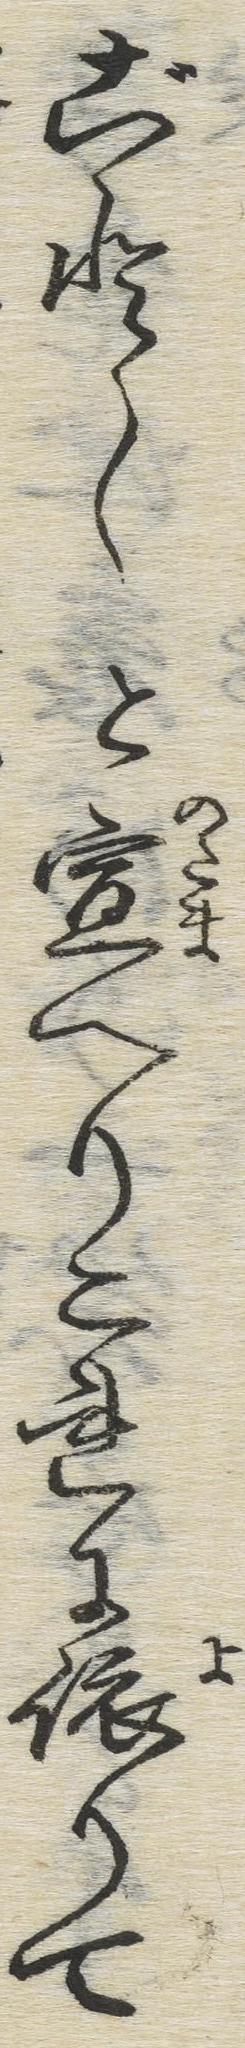ごとしと宣へりこれに依りて
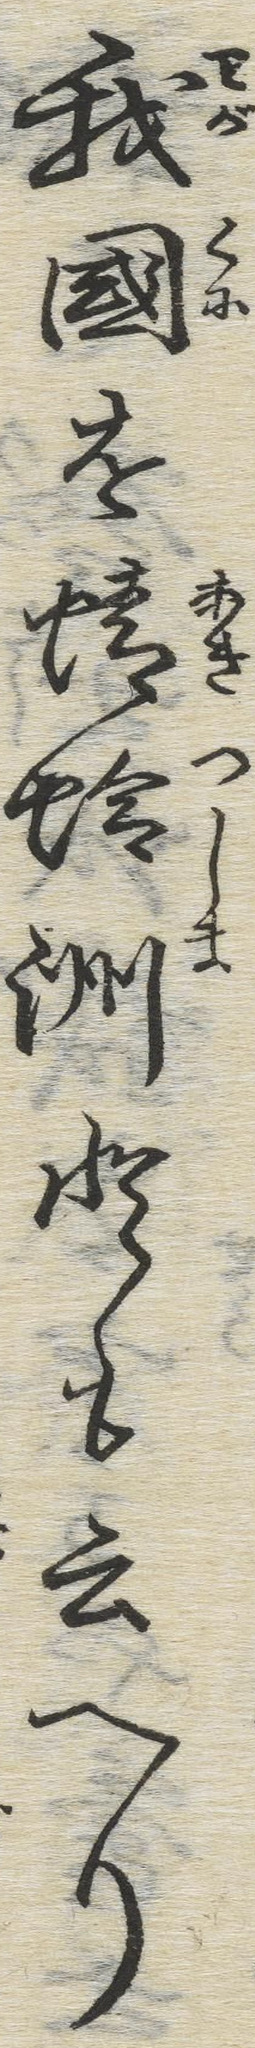我国を蜻蛉洲とも云へり
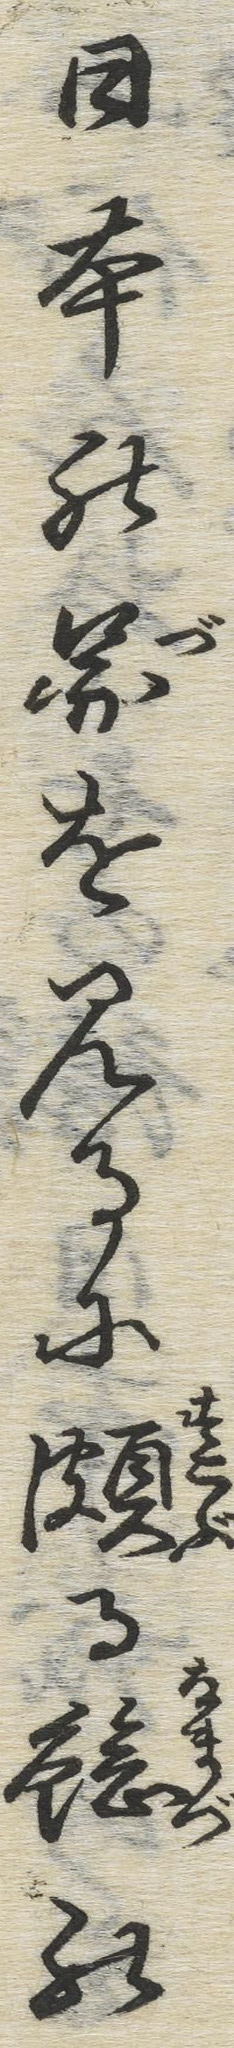日本の圖を見るに頗る鯰の
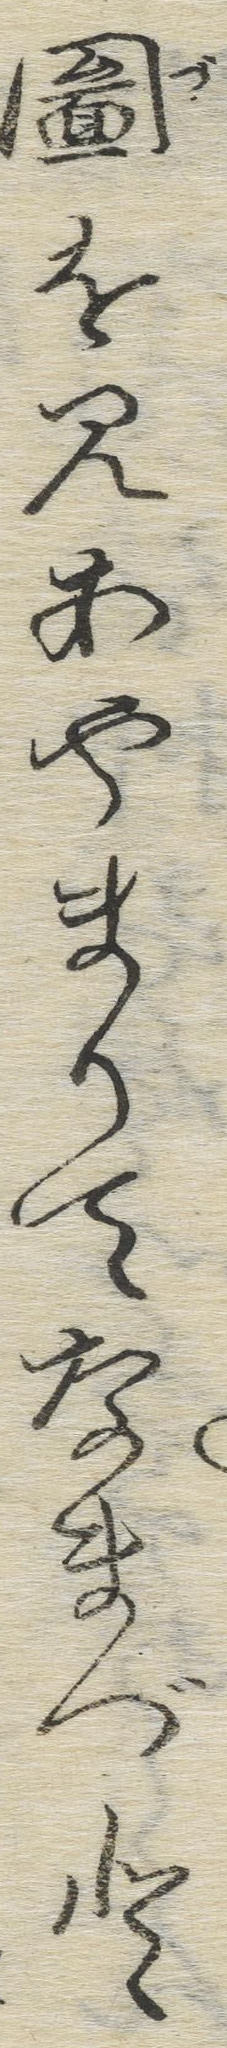圖を見あやまりてなまづと
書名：雷公地震由來記　全
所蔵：東京大学地震研究所図書室 Earthquake Research Institute Library, The University of Tokyo, JAPAN
